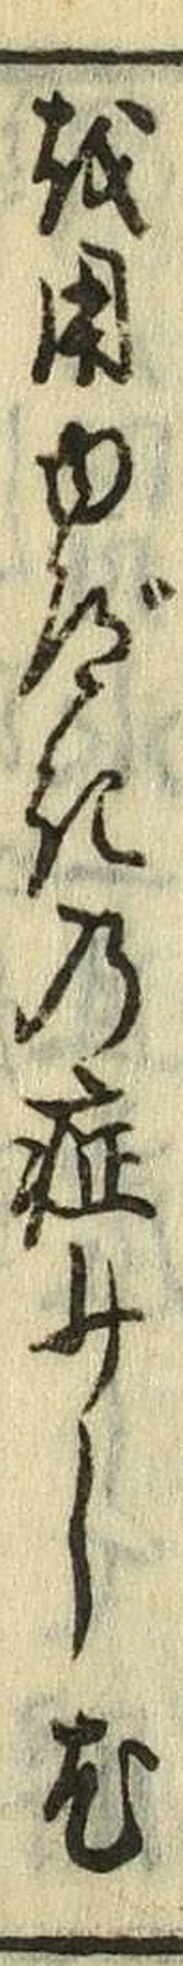を用ゆべきの症にし尤
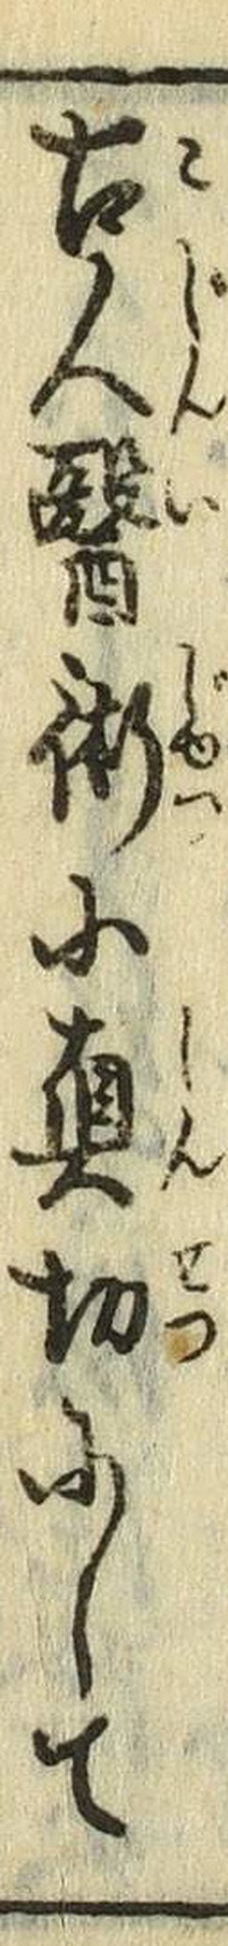古人医術に真切にして
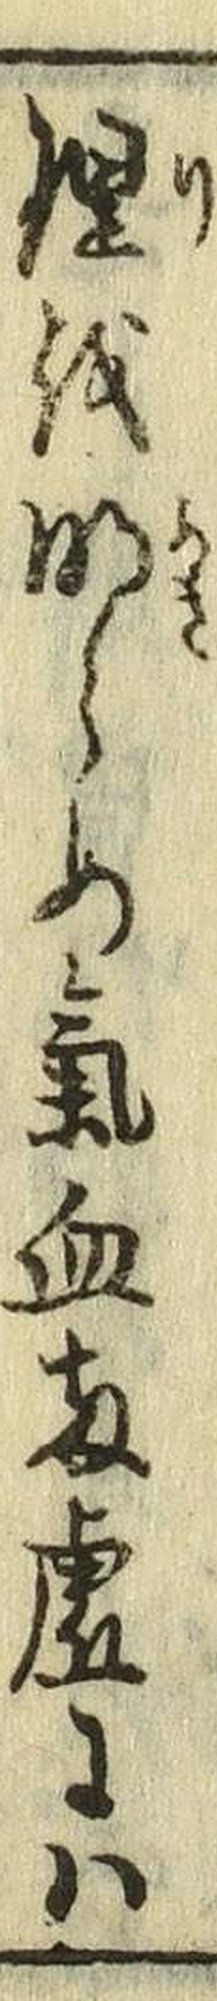理を明らめ気血両虚には
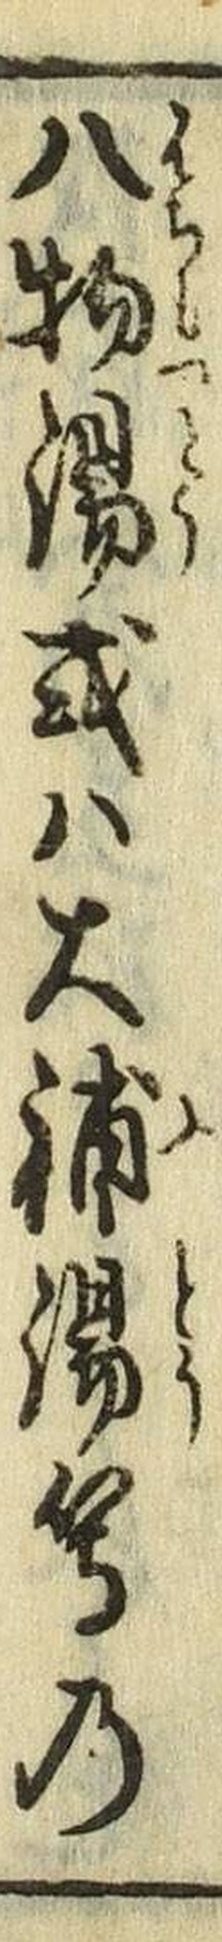八物湯或は大補湯等の
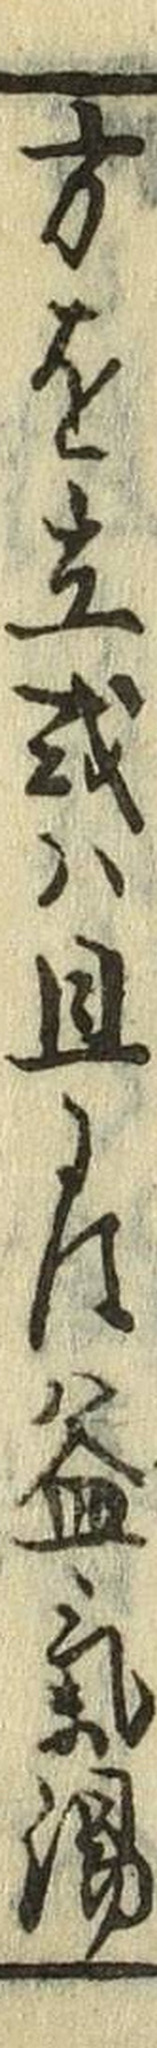方を立或は旦には益気湯
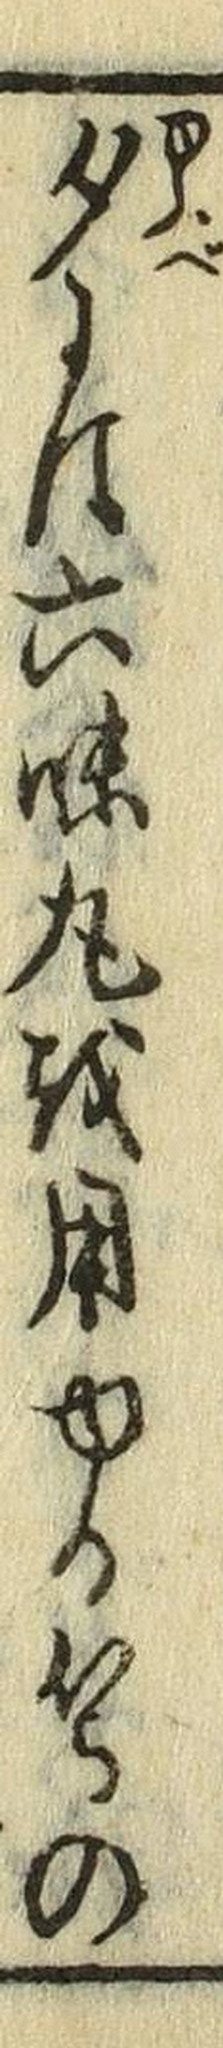夕には六味丸を用ゆる等の
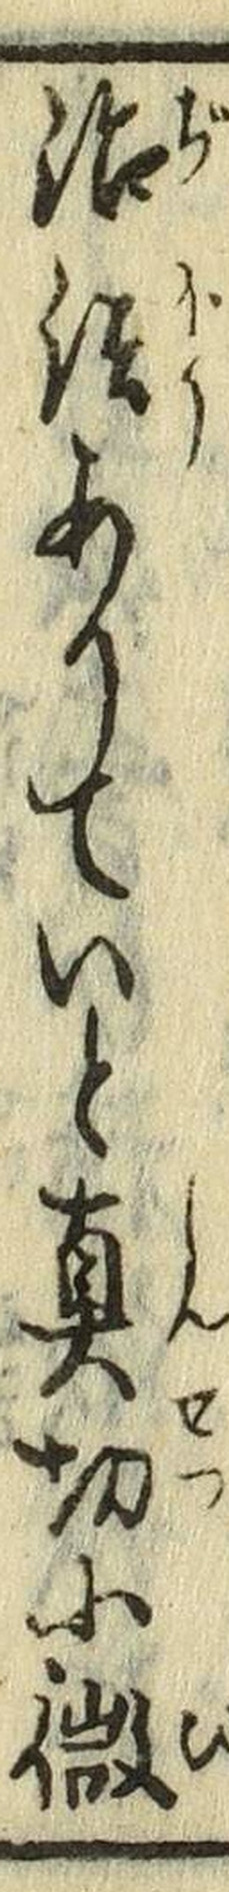治法ありていと真切に微
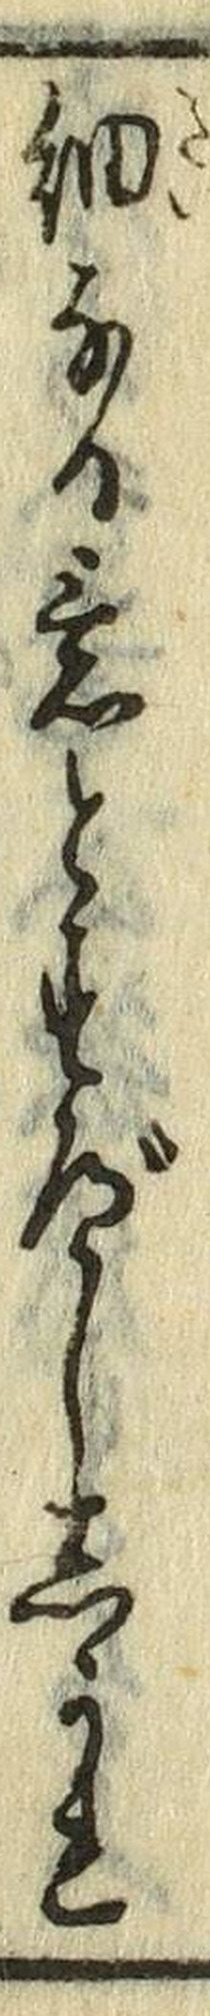細なる意とすべししかれ
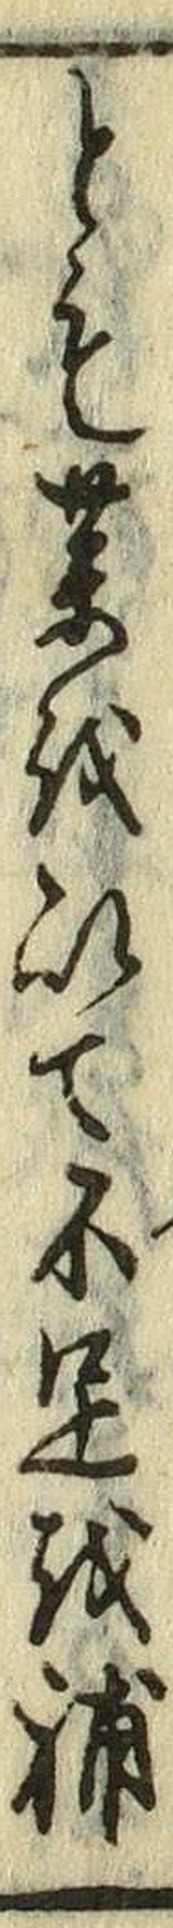とも薬を以て不足を補
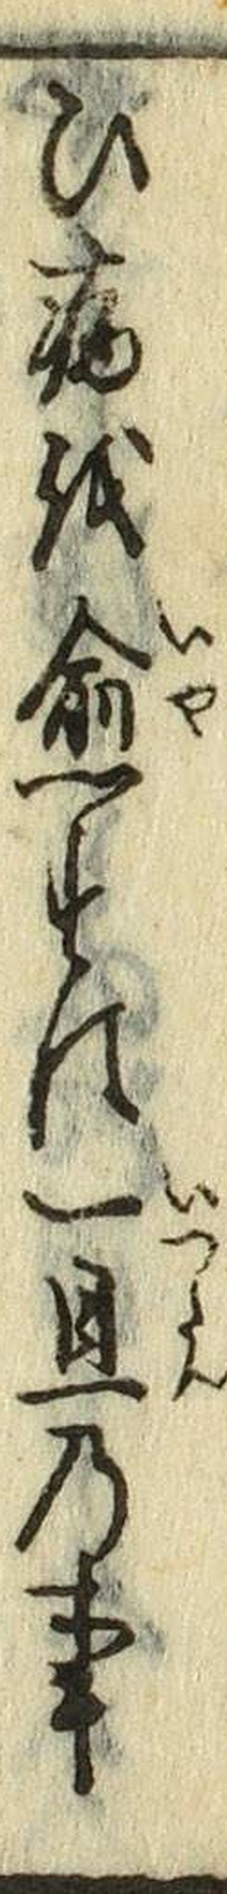ひ病を愈すは一旦の事
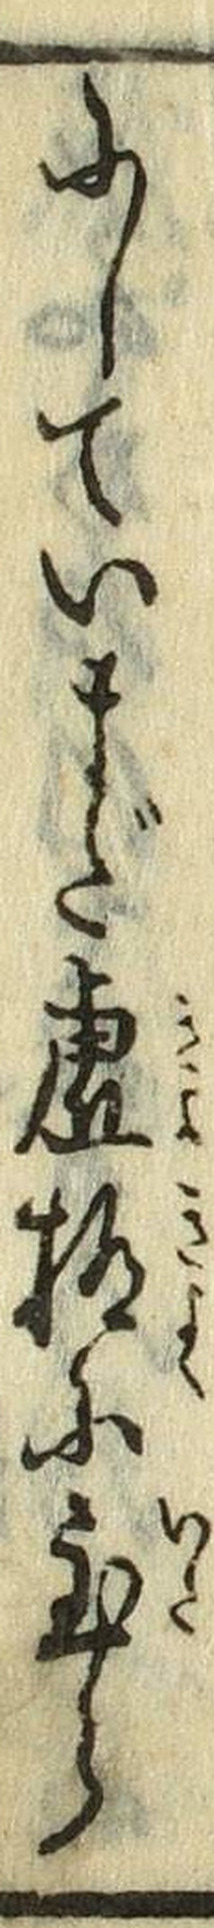にしていまだ虚極に至ら
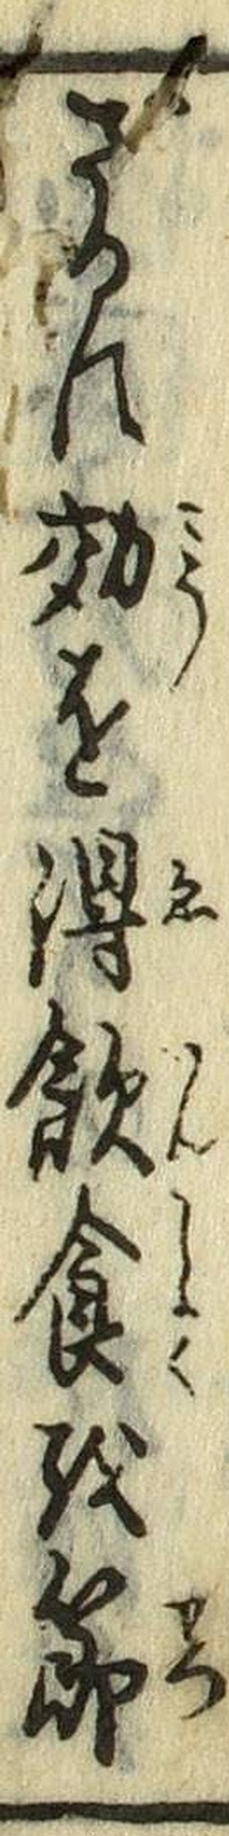ざるは効を得飲食を節
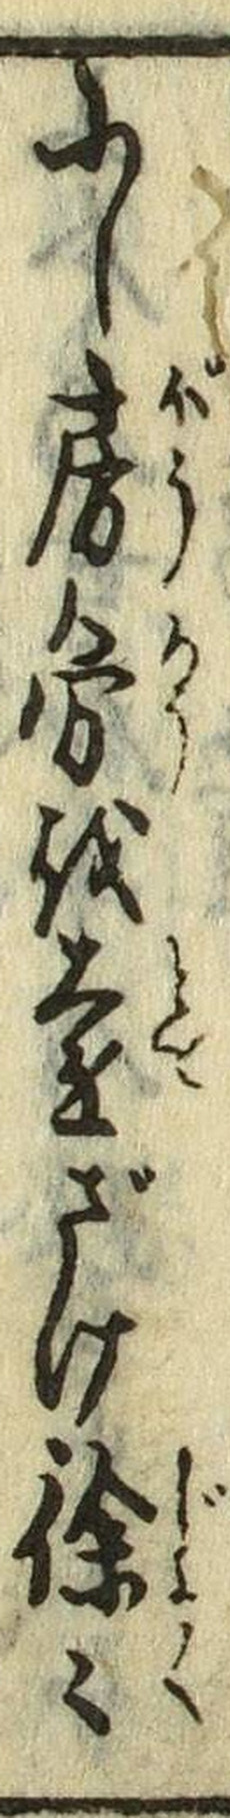にし房労を遠ざけ徐々
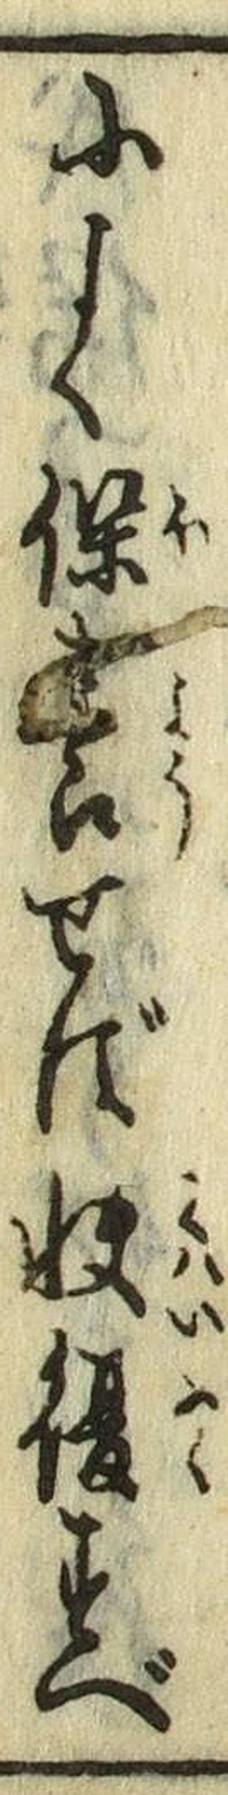によく保養せば快復すべ
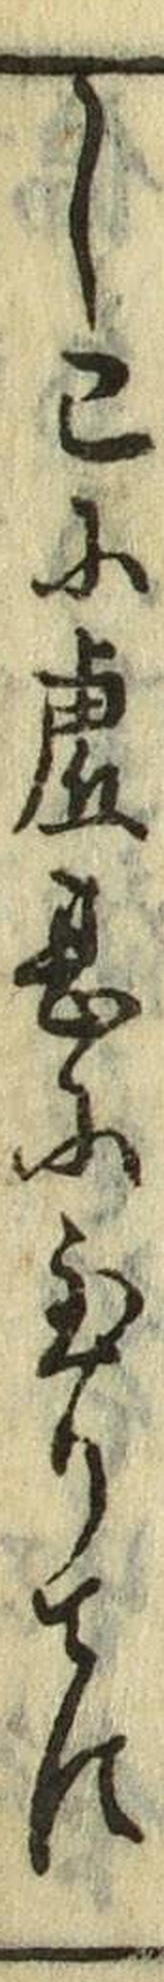し已に虚甚に至りては

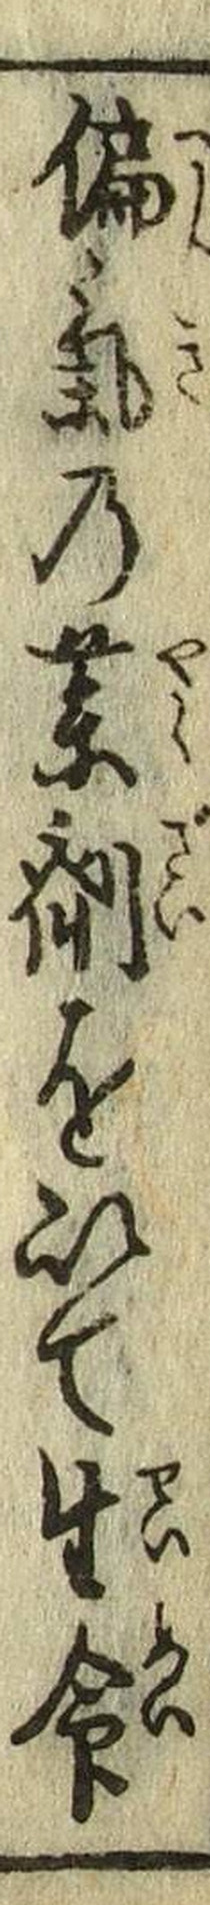偏気の薬剤を以て生命
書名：居家養生記
